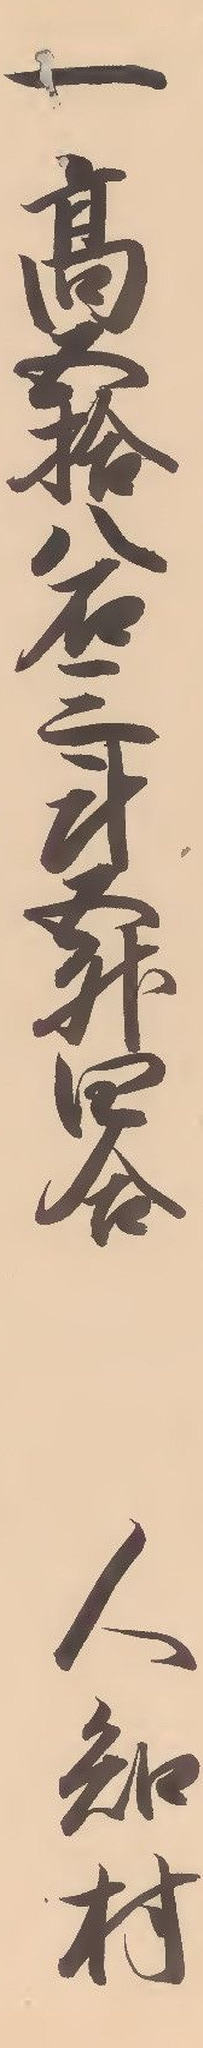一高五拾八石三斗五升四合人知村
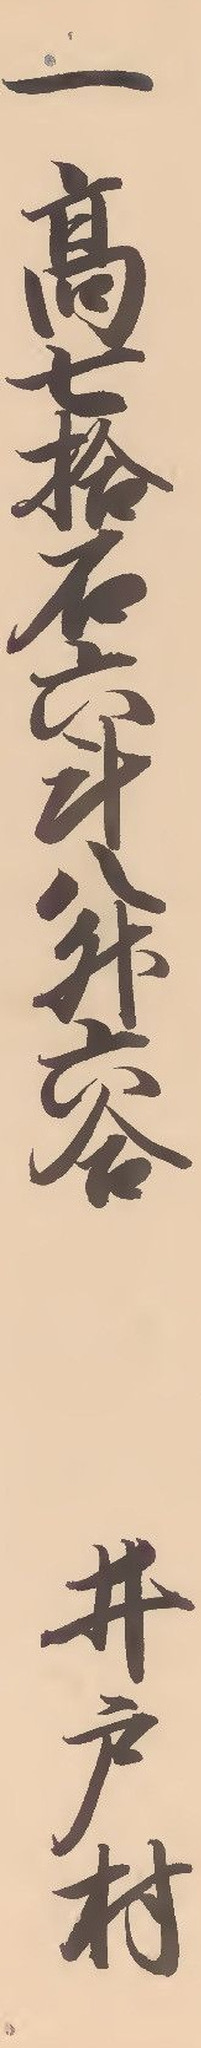一高七拾石六斗八升六合井戸村
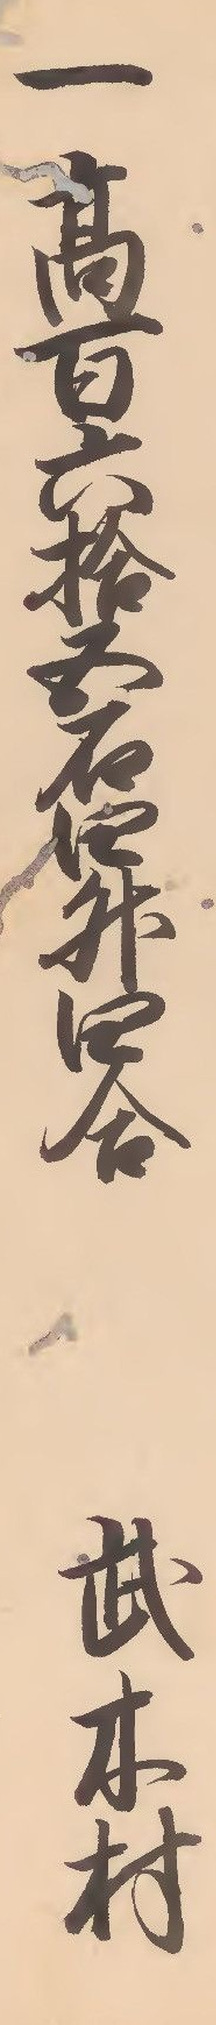一高百六拾五石四升四合武木村

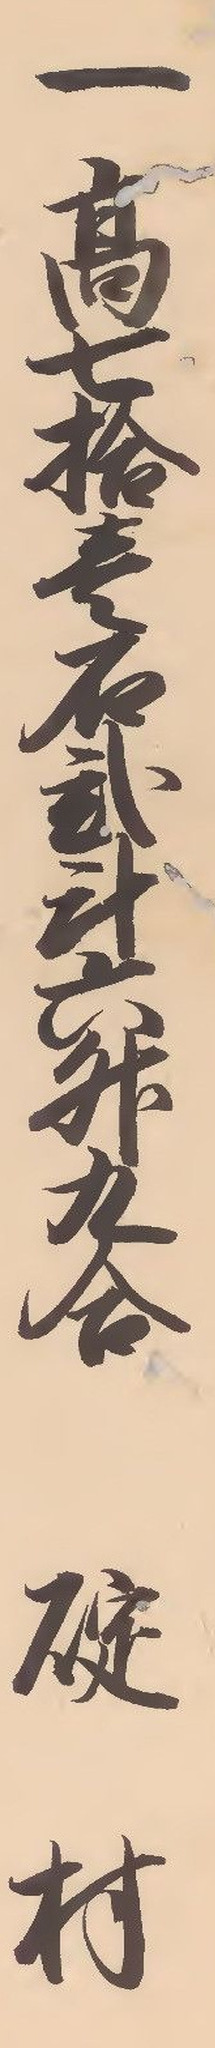一高七拾壱石弐斗六升九合碇村
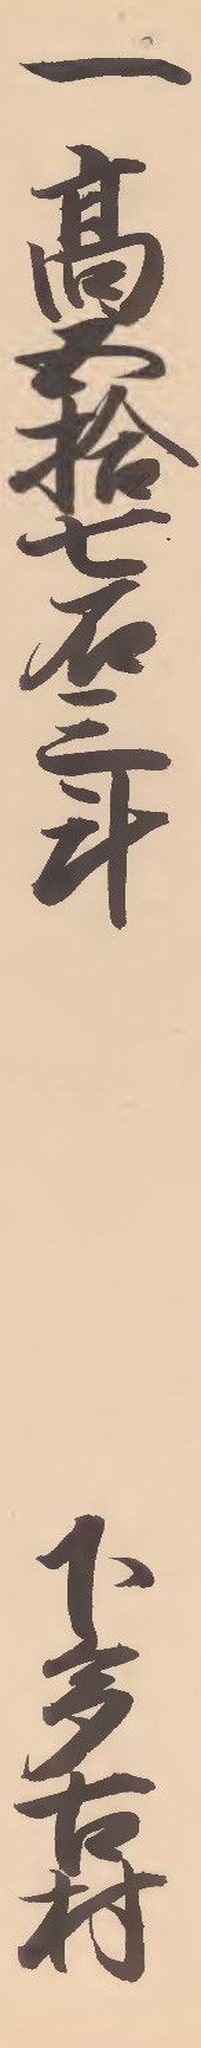一高五拾七石三斗下多古村
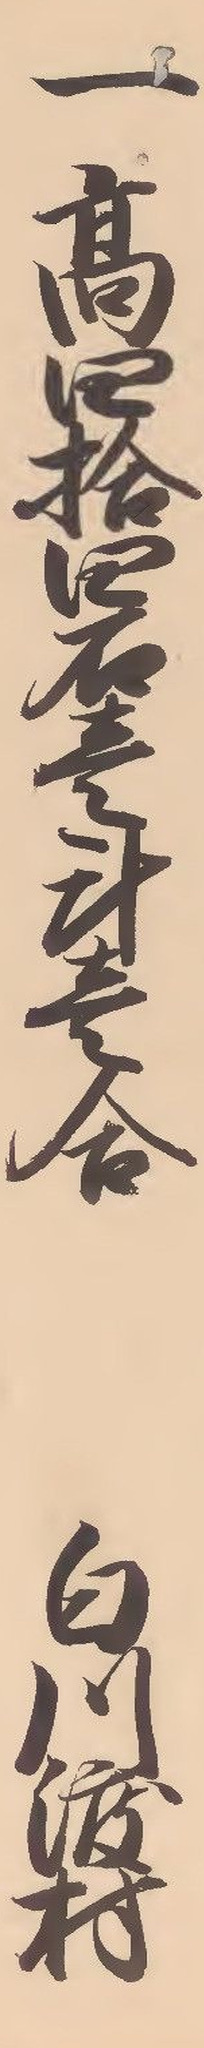一高四拾四石壱斗壱合白川渡村
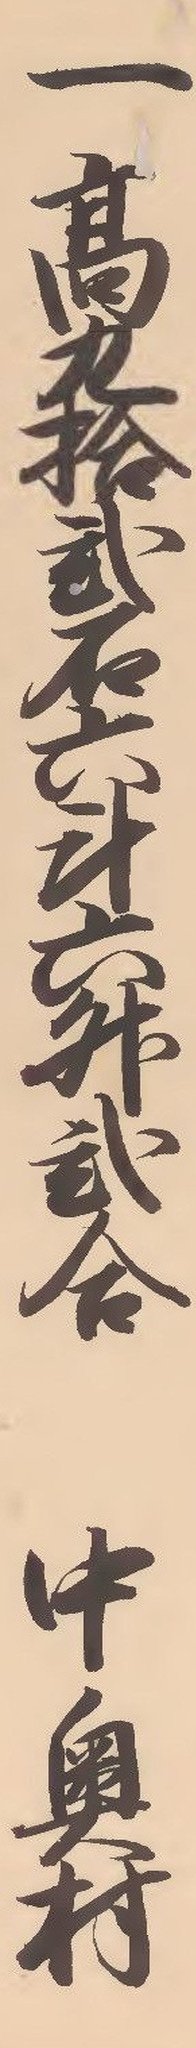一高九拾弐石六斗六升弐合中奥村
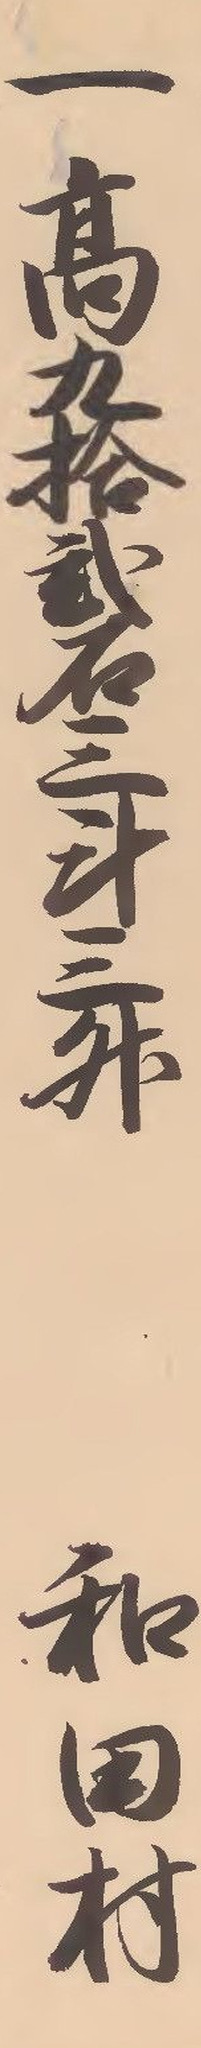一高九拾弐石三斗三升和田村
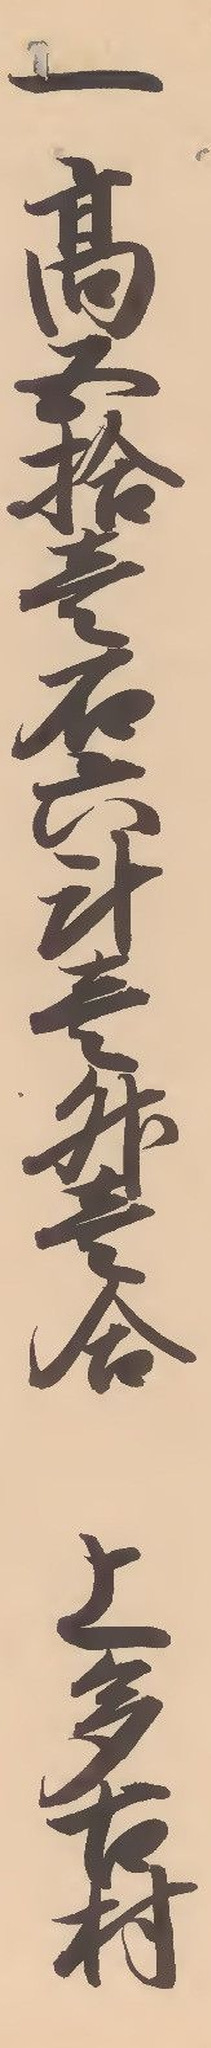一高五拾壱石六斗壱升壱合上多古村
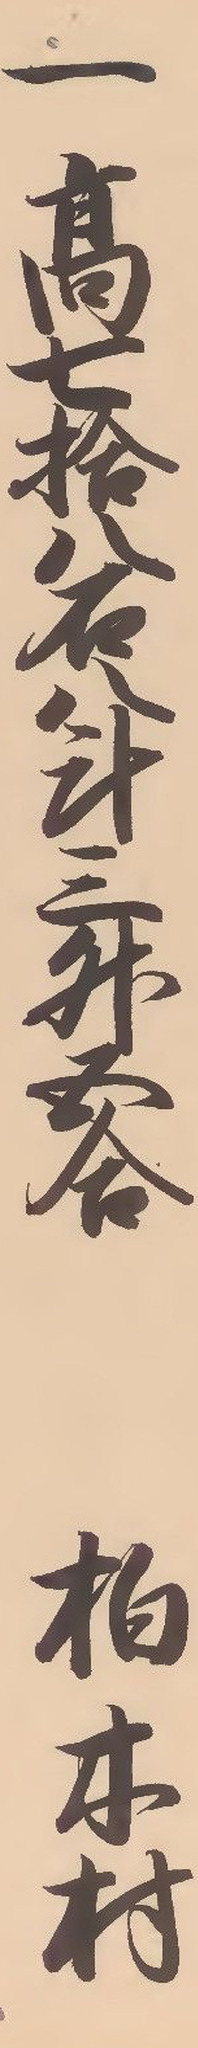一高七拾八石八斗三升五合柏木村
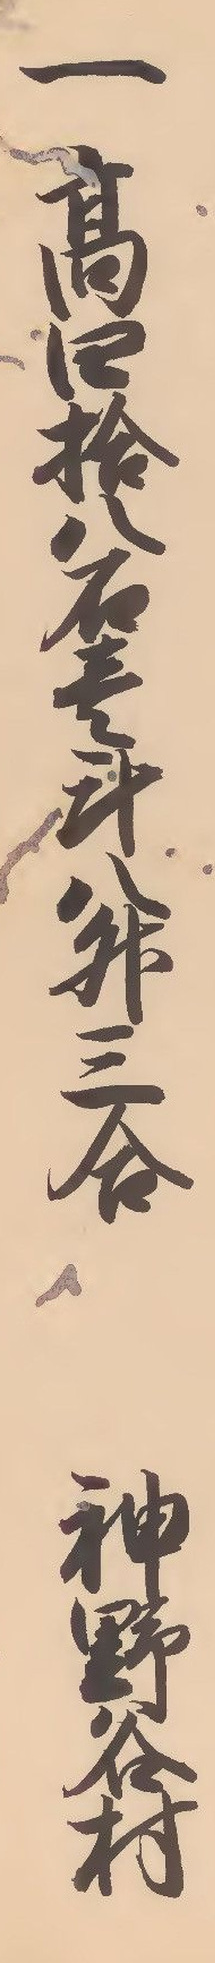一高四拾八石壱斗八升三合神野谷村

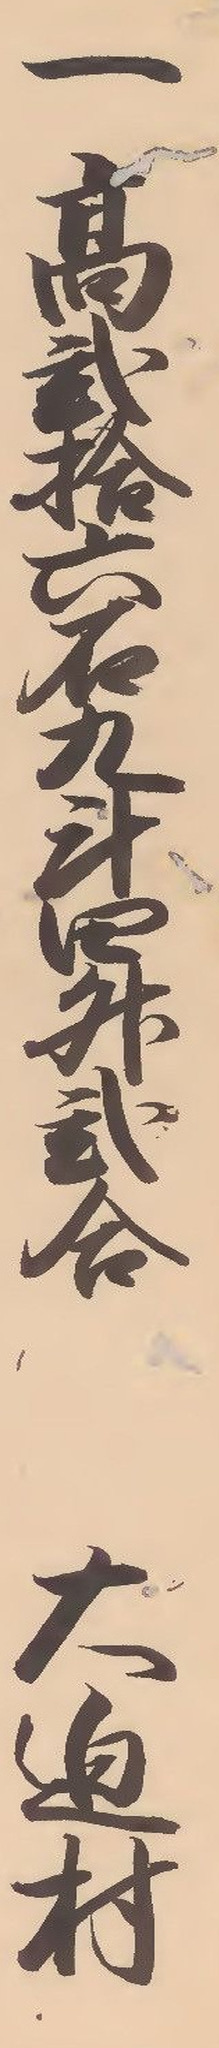一高弐拾六石九斗四升弐合大迫村
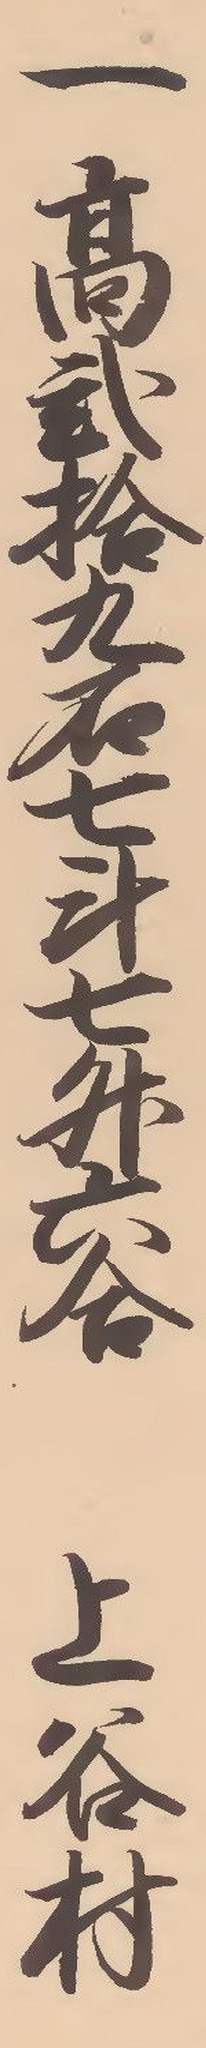一高弐拾九石七斗七升六合上谷村
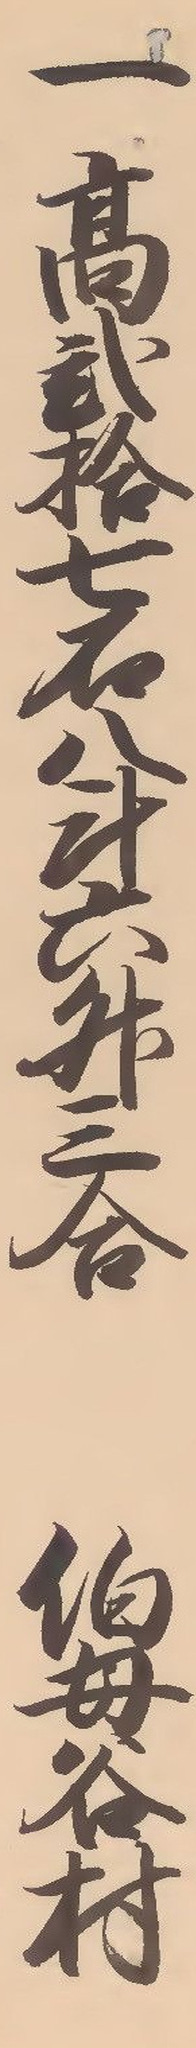一高弐拾七石八斗六升三合伯母谷村
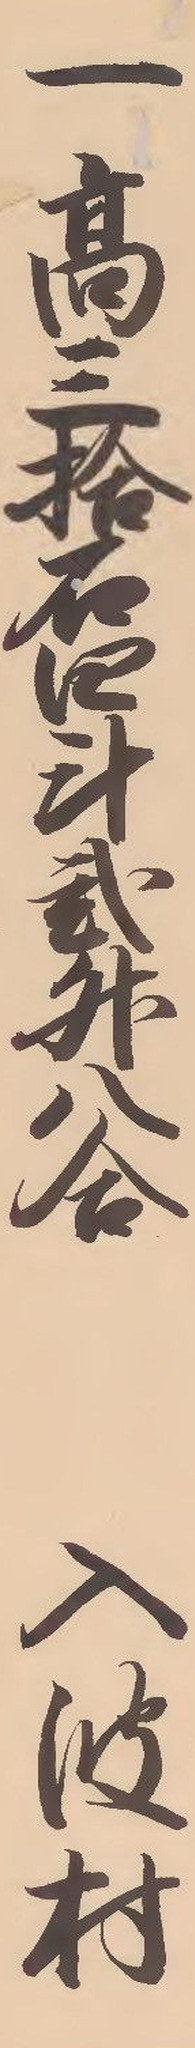一高三拾石四斗弐升八合入波村
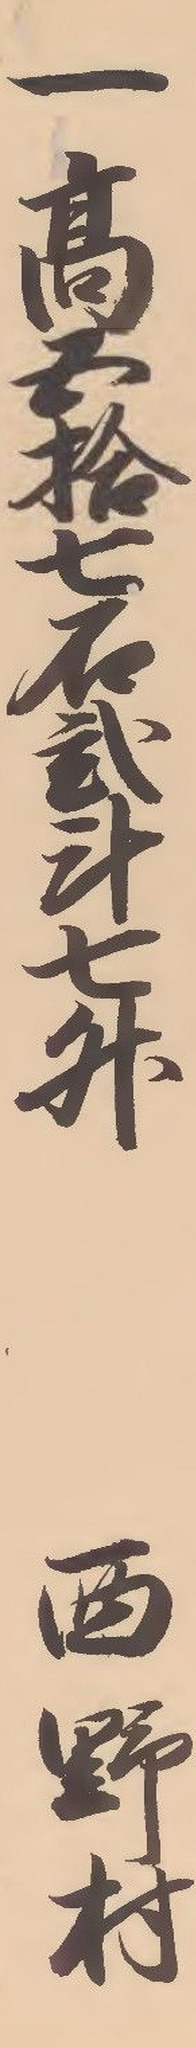一高五拾七石弐斗七升西野村
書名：大和国郷帳
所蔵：国立公文書館 National Archives of Japan
